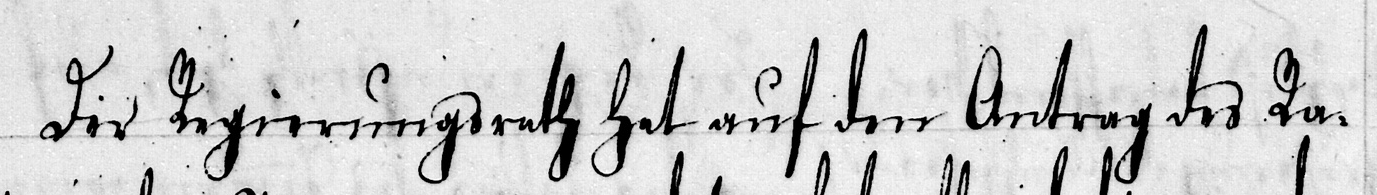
Der Regierungsrath hat auf den Antrag des Ra¬
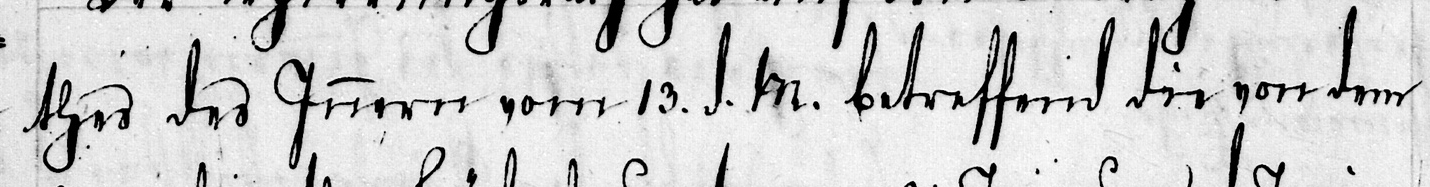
thes des Innern vom 13. d. M. betreffend die von dem
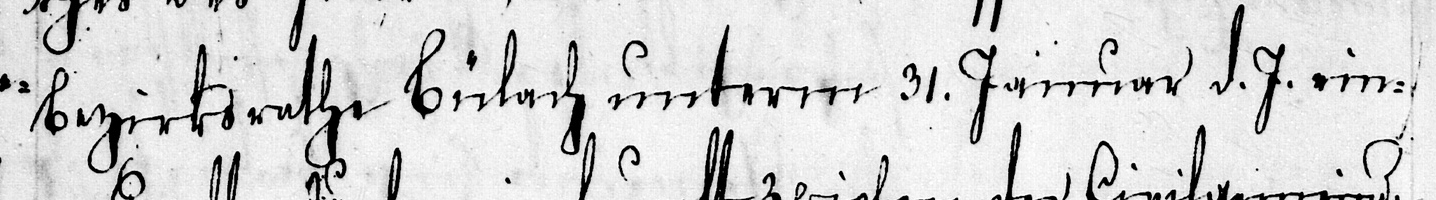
Bezirksrathe Bülach unterm 31. Januar d. J. ein¬
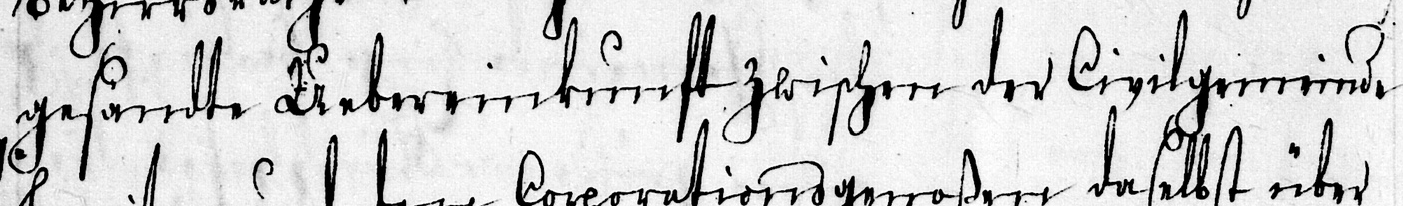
gesandte Uebereinkunft zwischen der Civilgemeinde
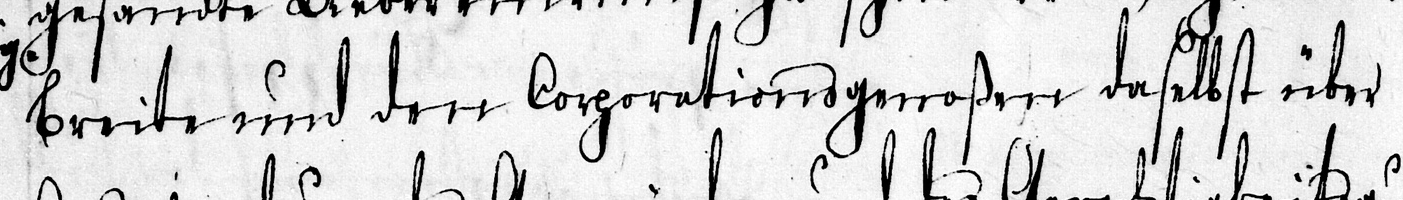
Breite und den Corporationsgenoßen daselbst über
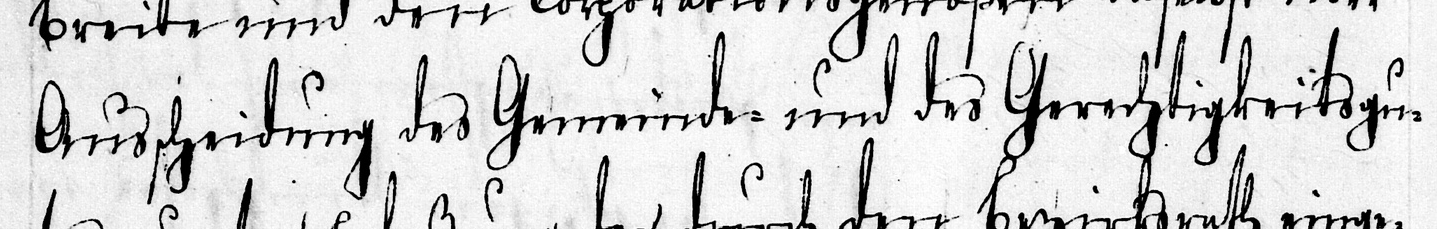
Ausscheidung des Gemeinde- und des Gerechtigkeitsgu¬
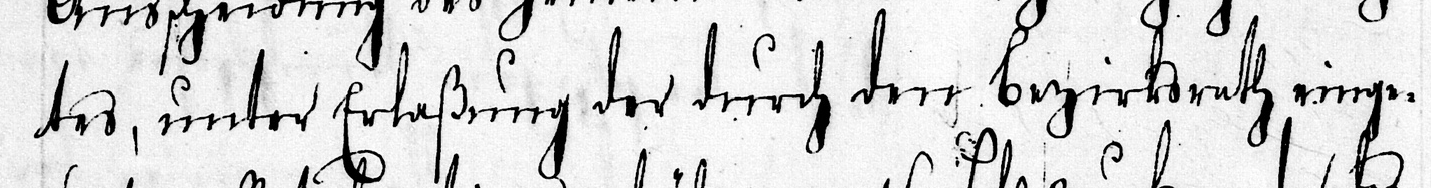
tes, unter Erlaßung der durch den Bezirksrath einge¬
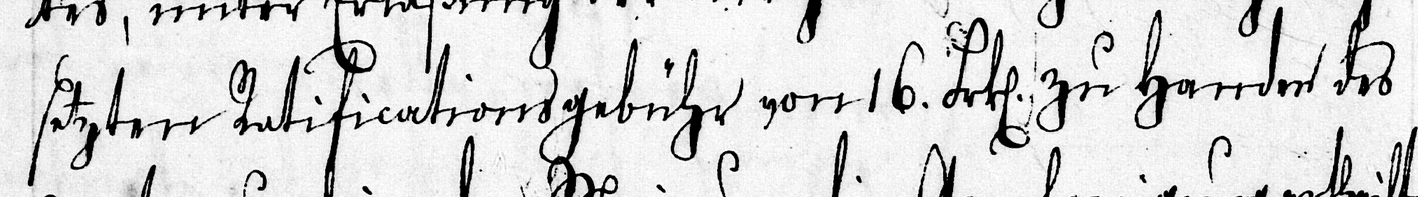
setzten Ratificationsgebühr von 16. Frk[en]. zu Handen
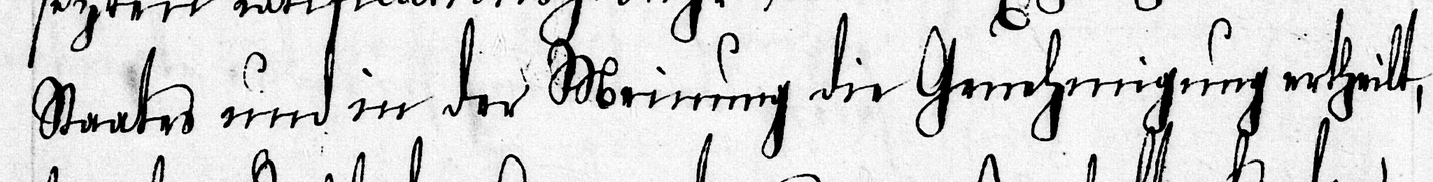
Staates und in der Meinung die Genehmigung ertheilt,
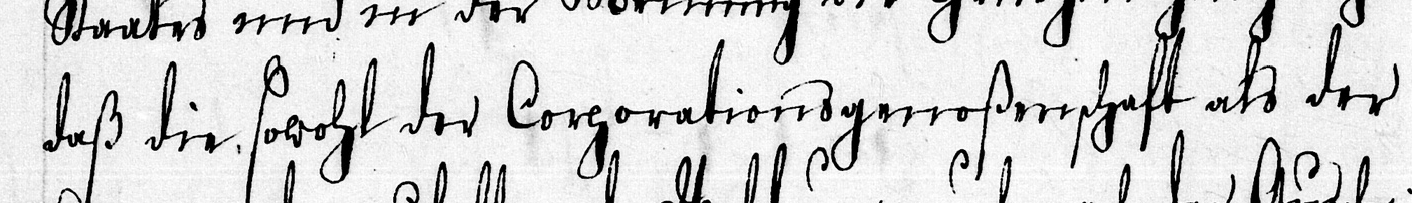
daß die sowohl der Corporationsgenoßenschaft als der
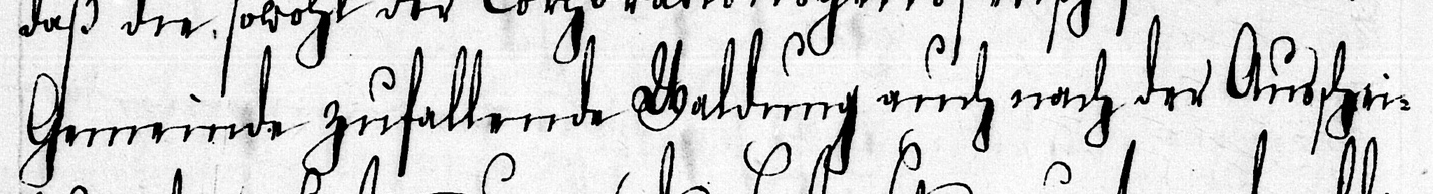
Gemeinde zufallende Waldung auch nach der Aussch¬
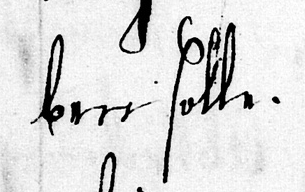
ben soll¬
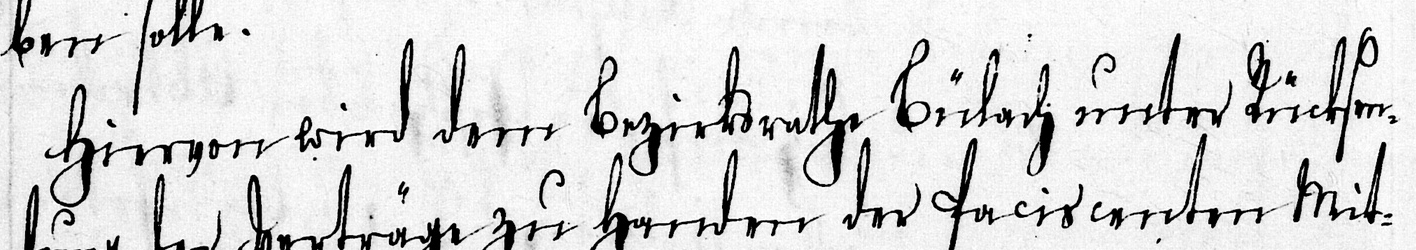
Hiervon wird dem Bezirksrathe Bülach unter Rückse¬
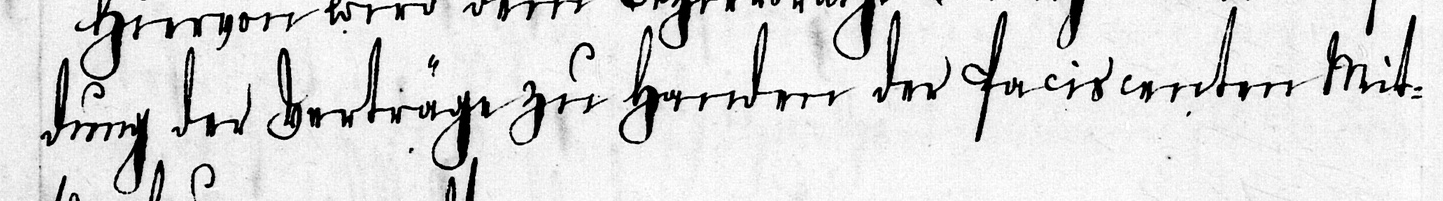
ndung der Verträge zu Handen der Paciscenten Mit¬
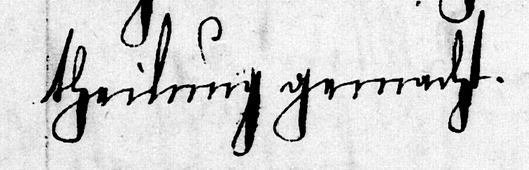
theilung gemacht.
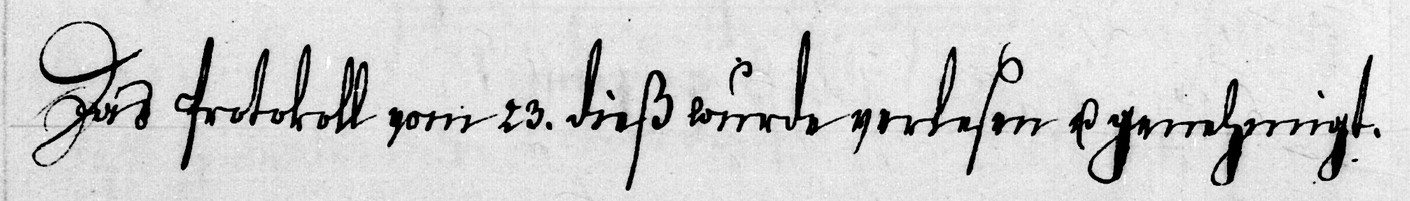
Das Protokoll vom 23. dieß wurde verlesen und genehmigt.
